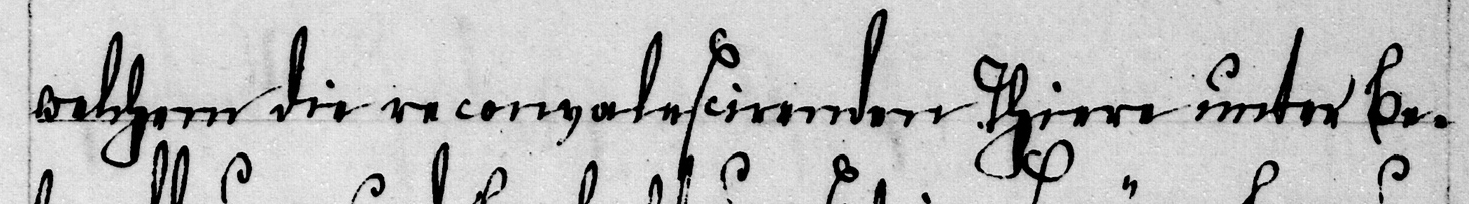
welchem die reconvalescirenden Thiere unter Be¬
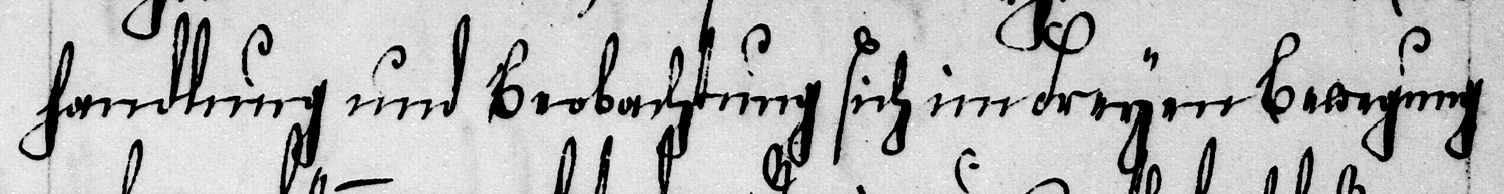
handlung und Beobachtung sich im Freyen Bewegung
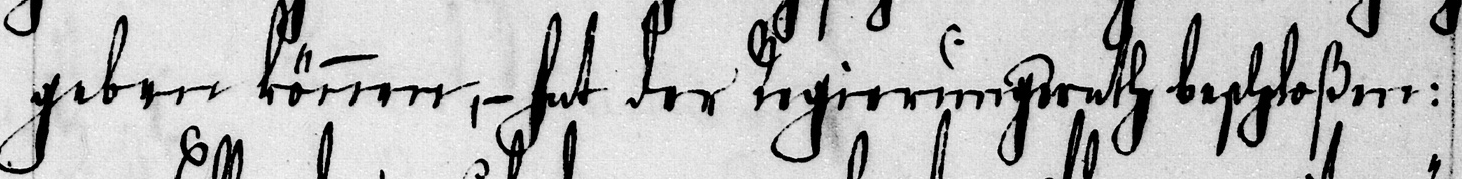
geben können, – hat der Regierungsrath beschloßen:
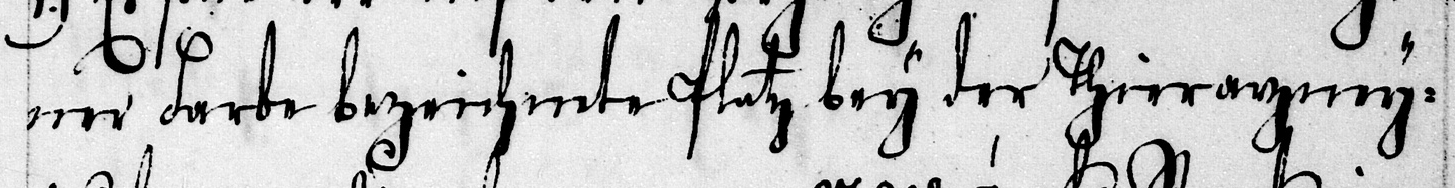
ner Farbe bezeichnete Platz bey der Thierarzney¬
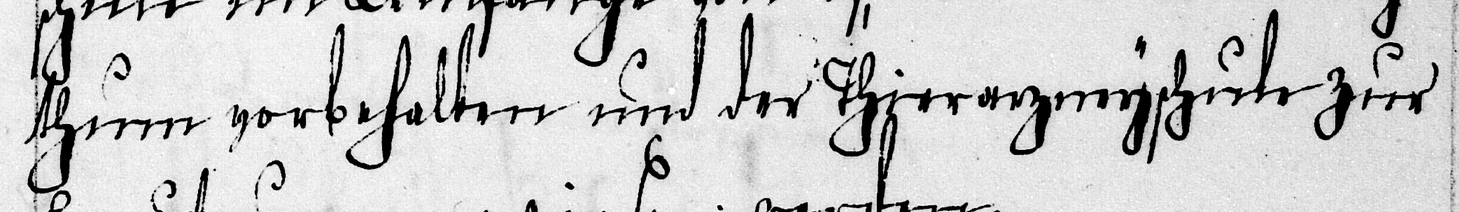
thum vorbehalten und der Thierarzneyschule zur
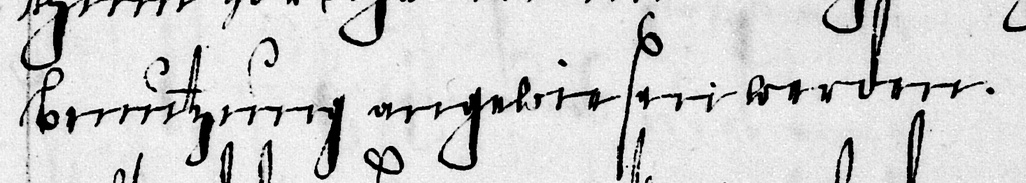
Benutzung angewiesen werden.
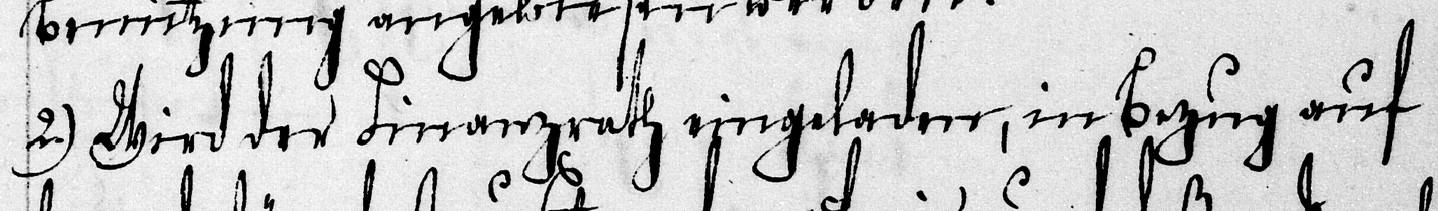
2.) Wird der Finanzrath eingeladen, in Bezug auf
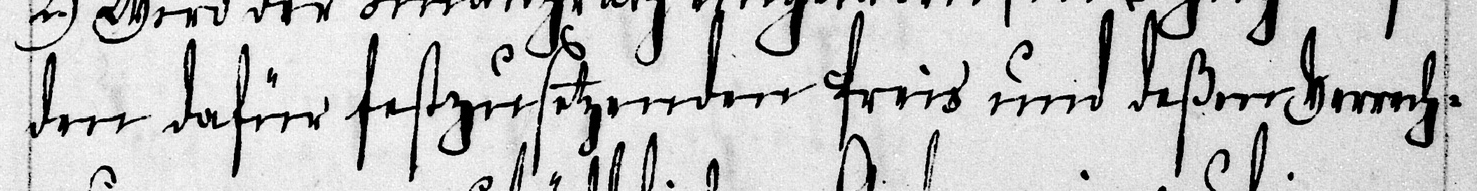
den dafür festzusetzenden Preis und deßen Verrec¬
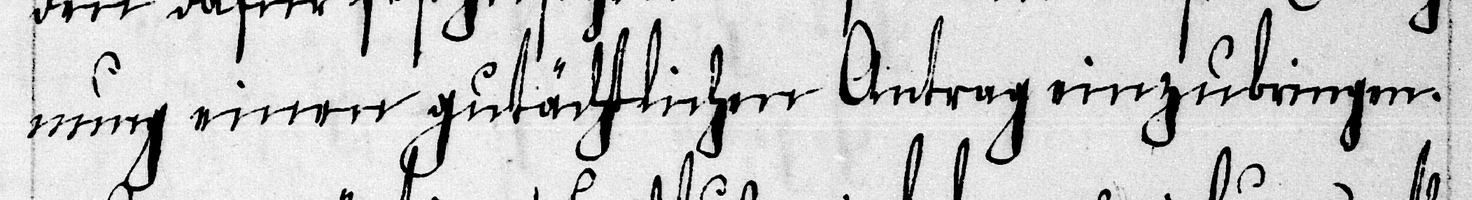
hnung einen gutächtlichen Antrag einzubringen.
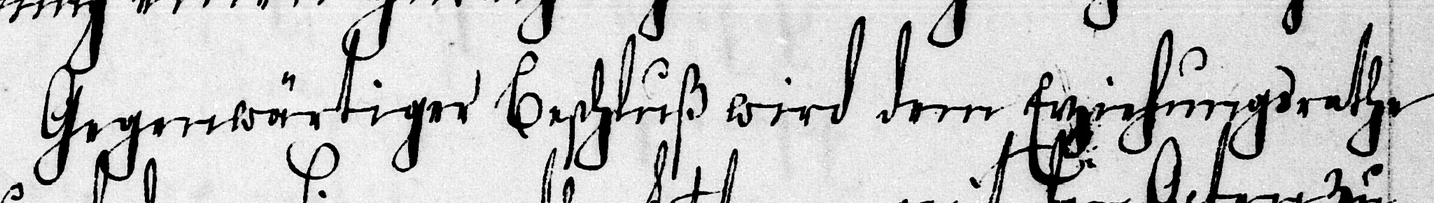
Gegenwärtiger Beschluß wird dem Erziehungsrathe
